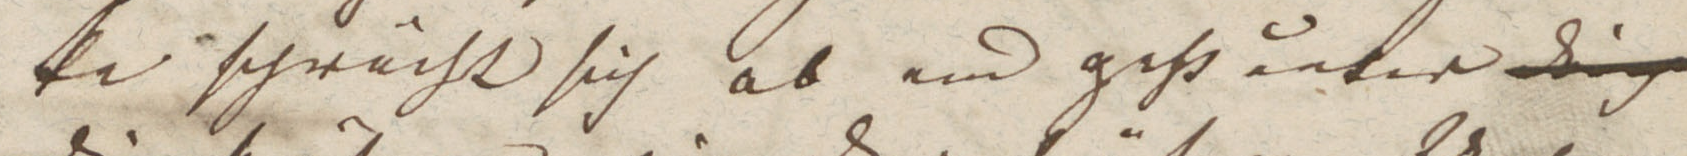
ke schwächt sich ab und geht unter durch
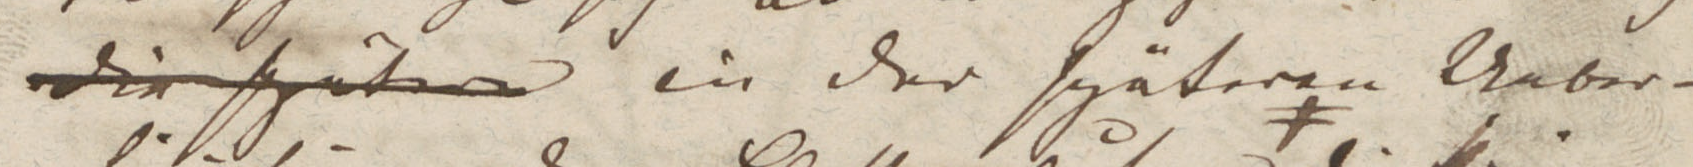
die spätere in der späteren Ueber-
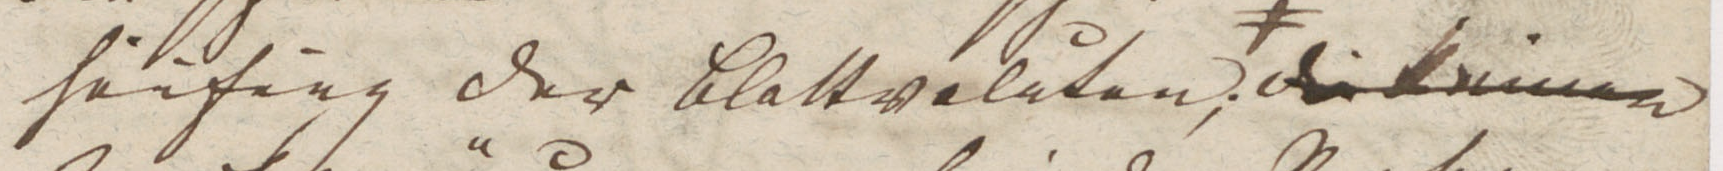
häufung der Blattvoluten; % die keinen
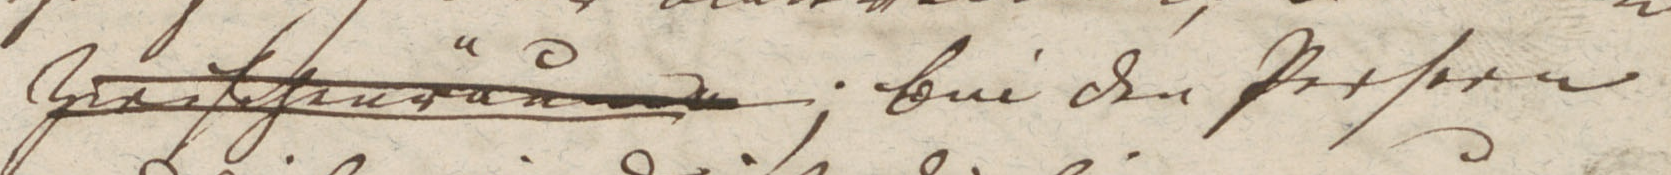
Zwischenräume; Bei den Persern
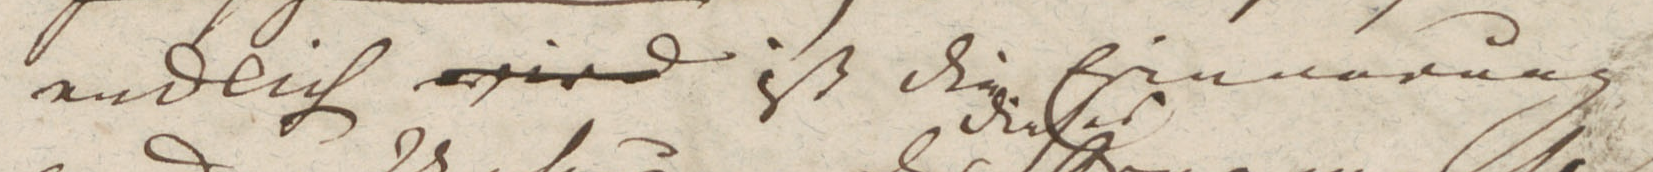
endlich wird ist die Erinnerung
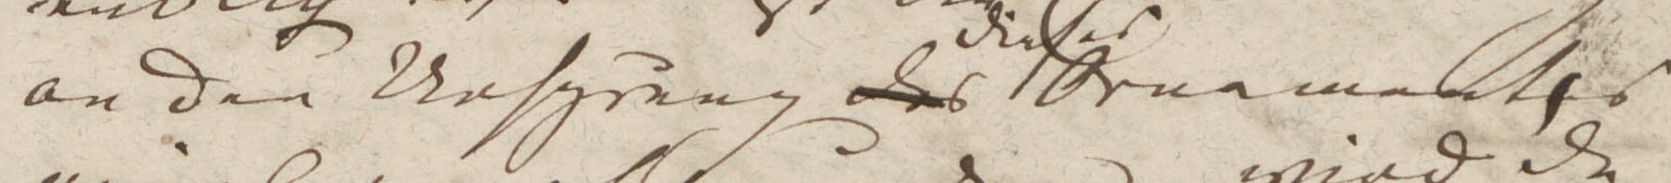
an den Ursprung das dieses Ornamentes
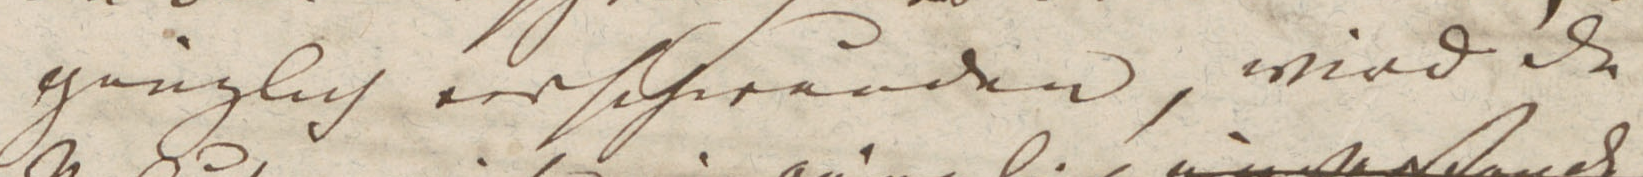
gänzlich verschwunden, wird die
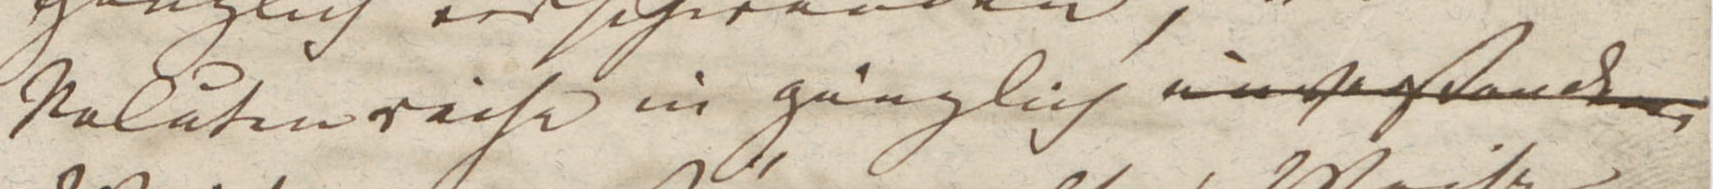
Volutenreihe in gänzlich unverstandener
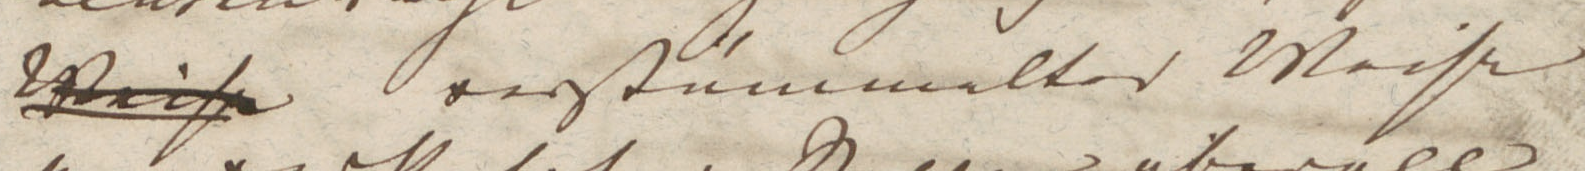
Weise verstümmelter Weise
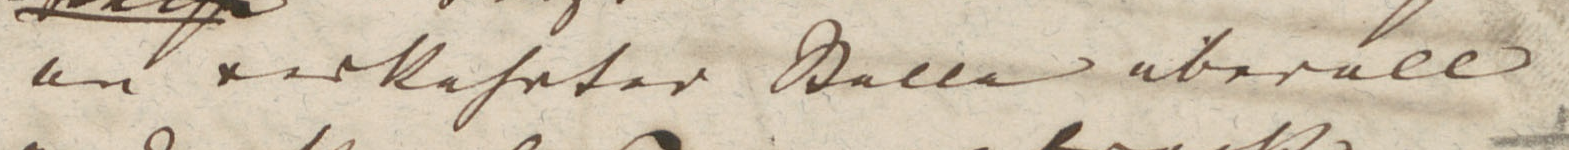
an verkehrter Stelle überall
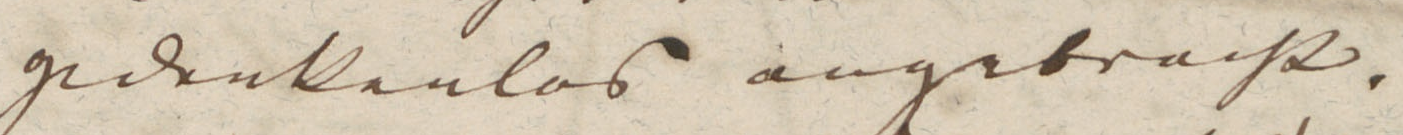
gedankenlos angebracht. %
